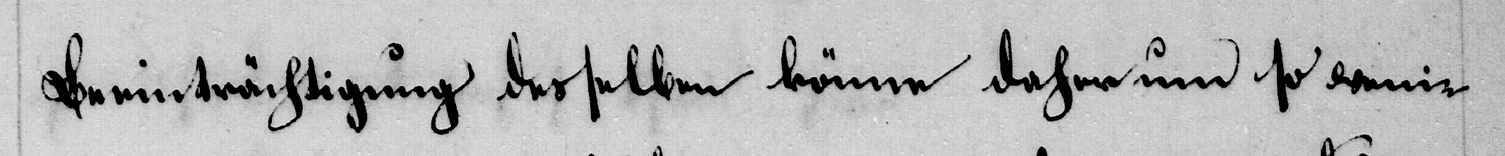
Beeinträchtigung derselben könne daher um so weni¬
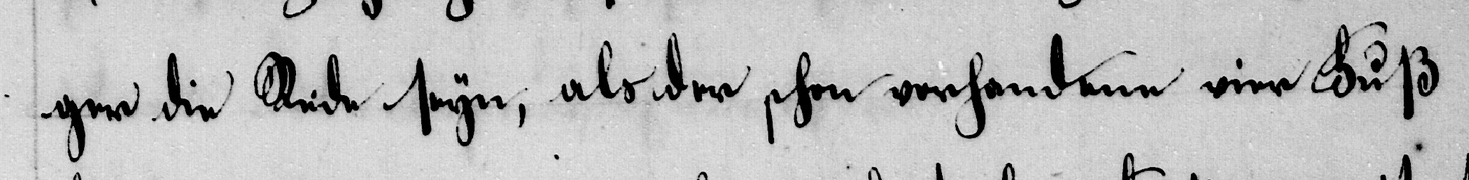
ger die Rede seyn, als der schon vorhandene vier Fuß
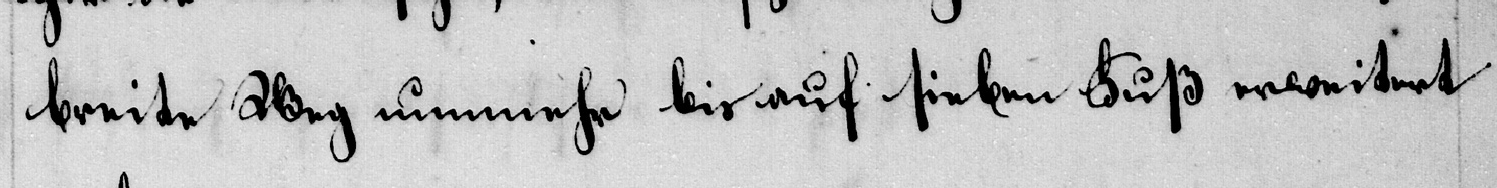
breite Weg nunmehr bis auf sieben Fuß erweitert
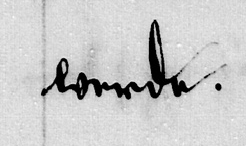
werde.
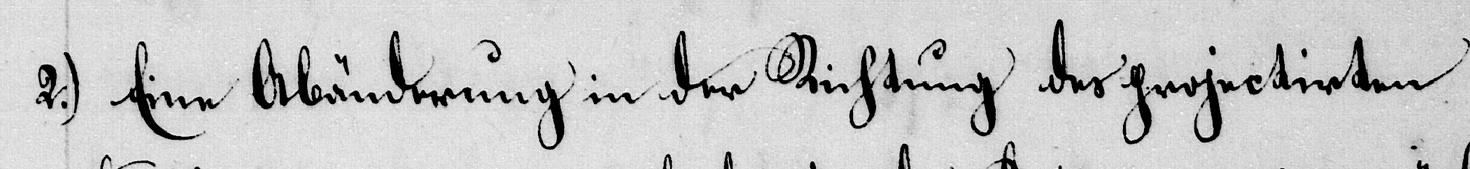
2.) Eine Abänderung in der Richtung des projectirten
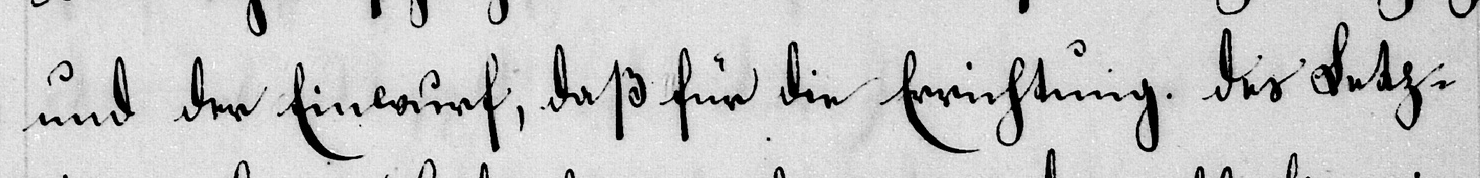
und der Einwurf, daß für die Errichtung des Letz¬
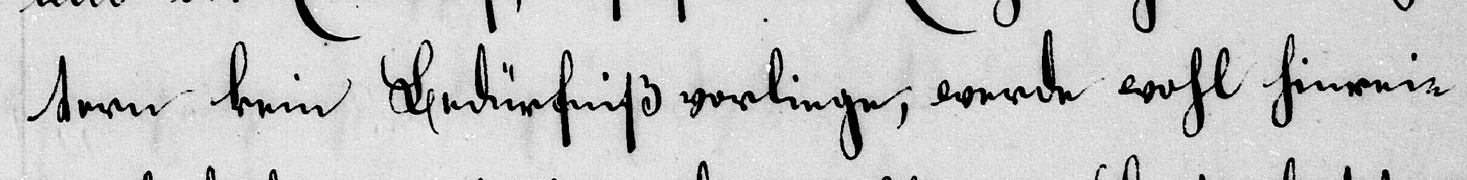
tern kein Bedürfniß vorliege, werde wohl hinrei¬
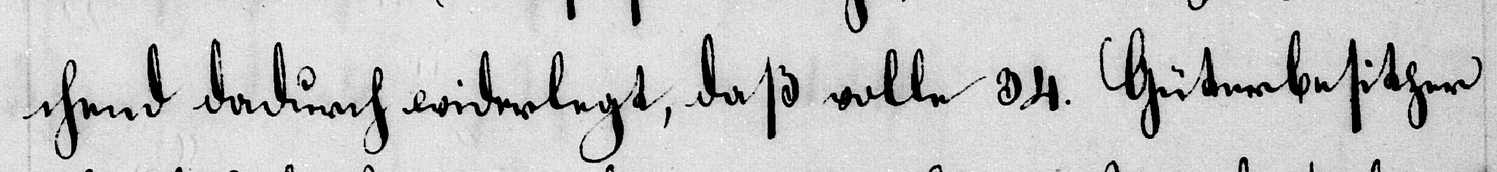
chend dadurch widerlegt, daß volle 34. Güterbesitzer
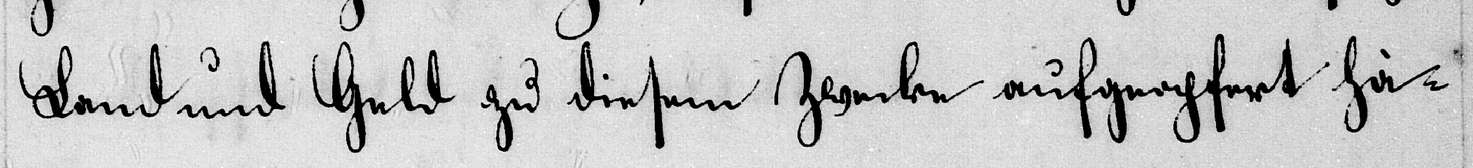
Land und Geld zu diesem Zwecke aufgeopfert ha¬
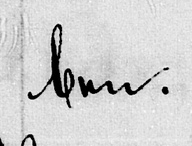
ben.
